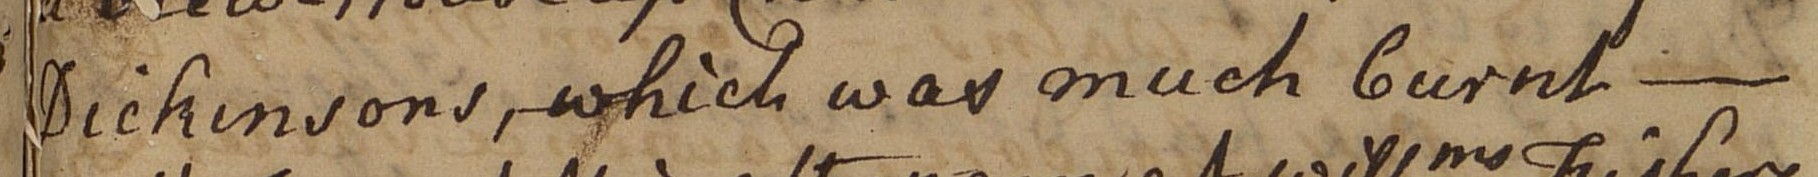Dickinsons, which was much burnt-
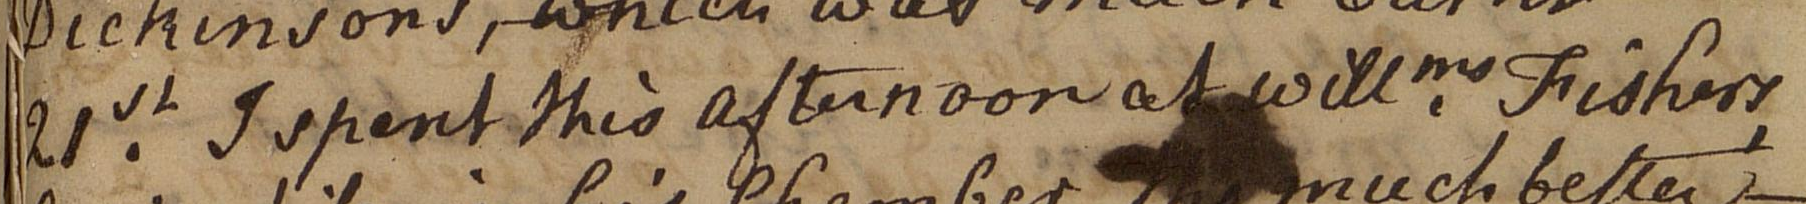21^st I spent this afternoon at will^ms. Fishers
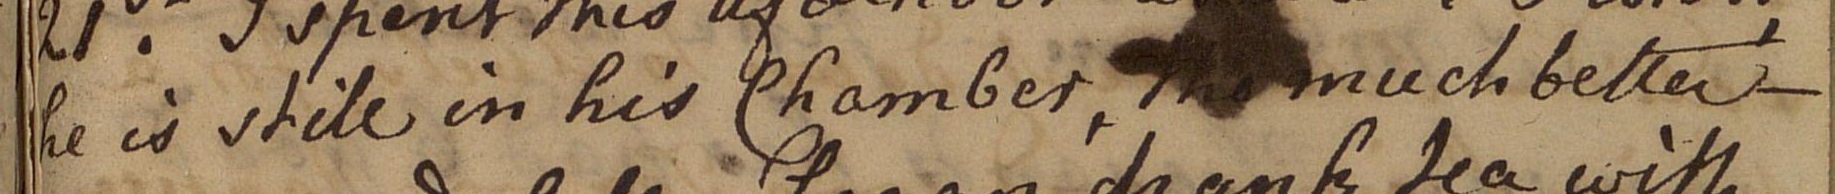he is still in his Chamber, tho much better
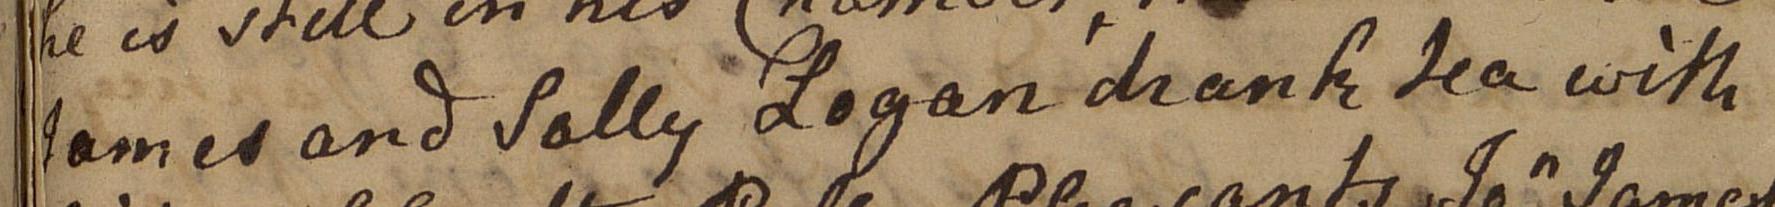James and Sally Logan drank tea with
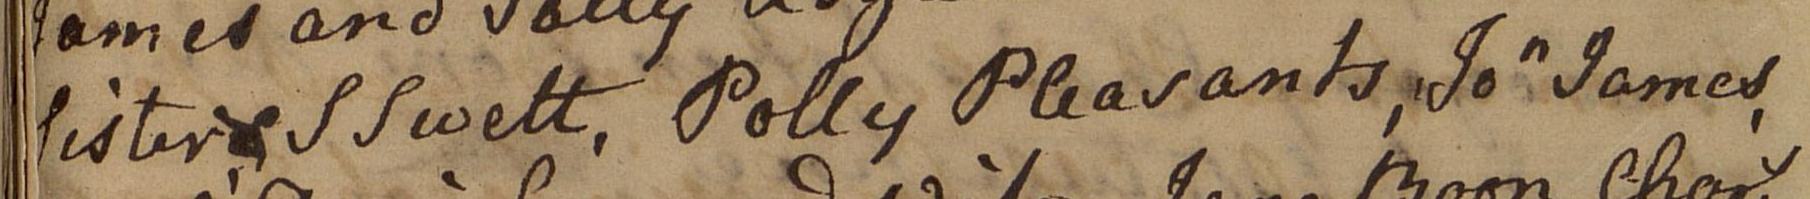Sisters, S Swett, Polly Pleasants, Jo^n James,
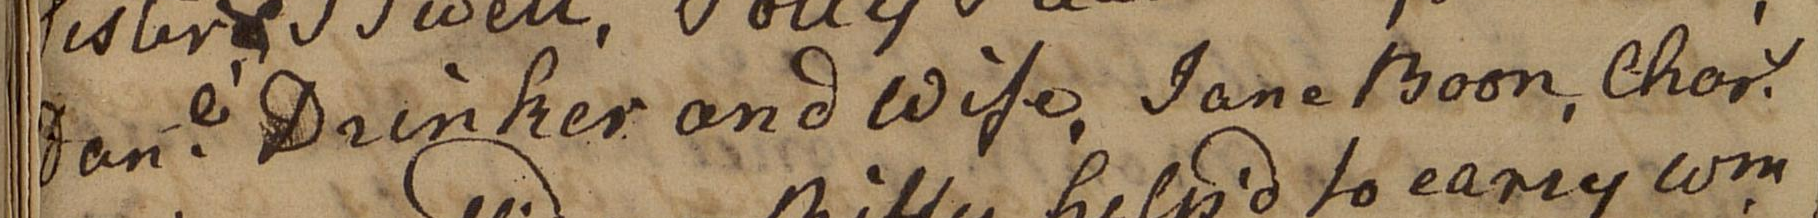Dan^l. Drinker and Wife, Jane Boon, Char.^s
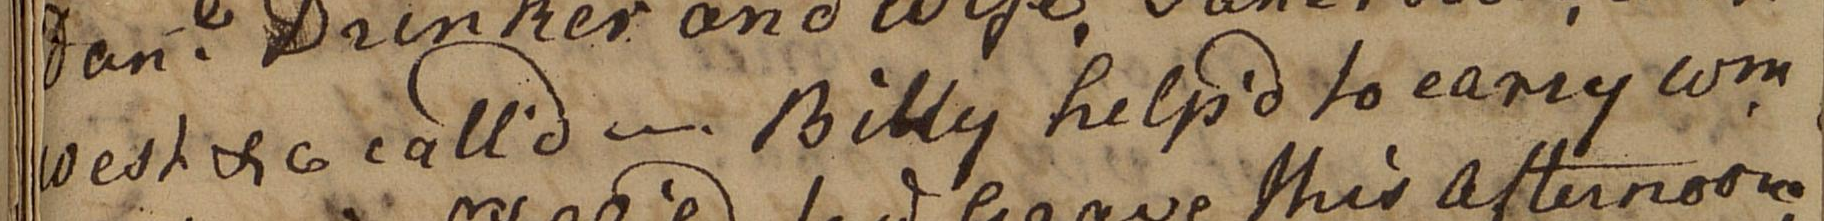west &c call'd- Billy help'd to carry W^m
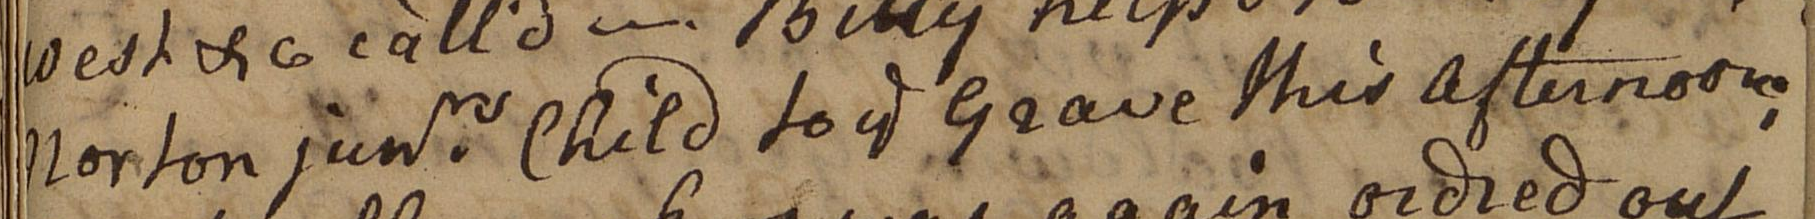Norton jun^rs Child to y^e Grave this Afternoon,
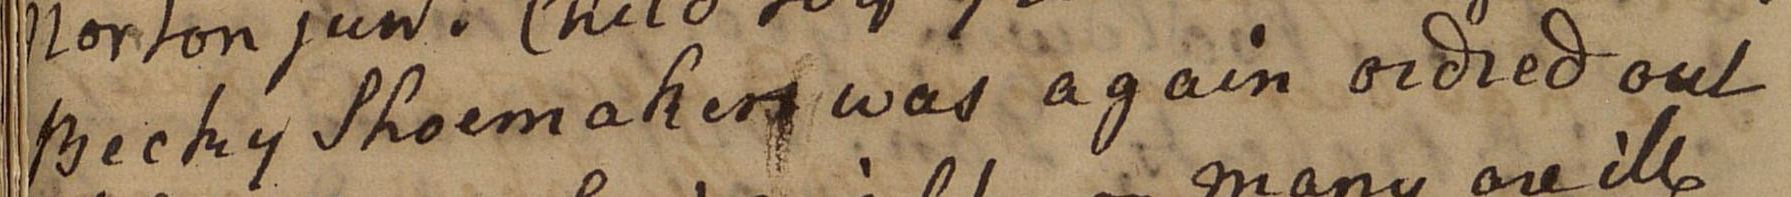Becky Shoemakers was again ordred out
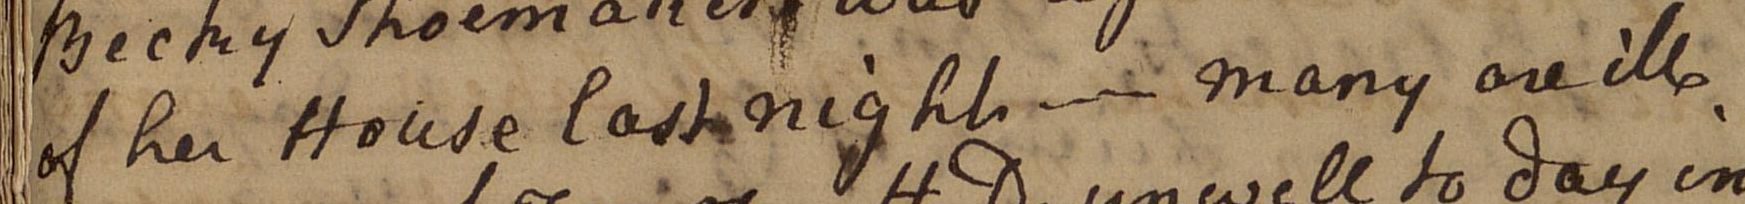of her House East night- many are ill,
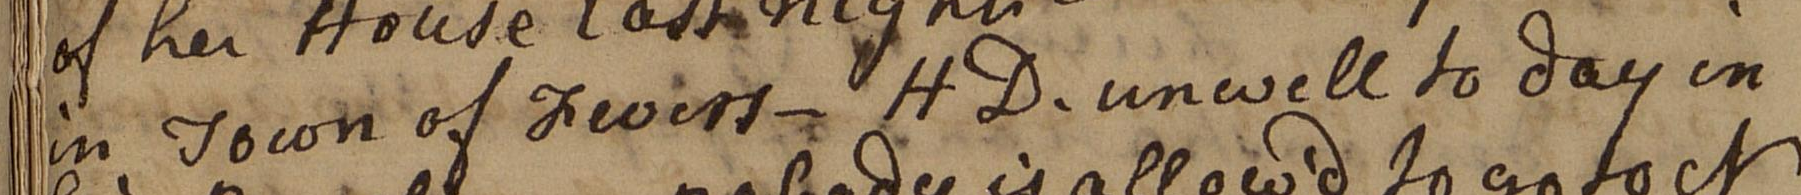in Town of Fevers- H D- unwell to day in
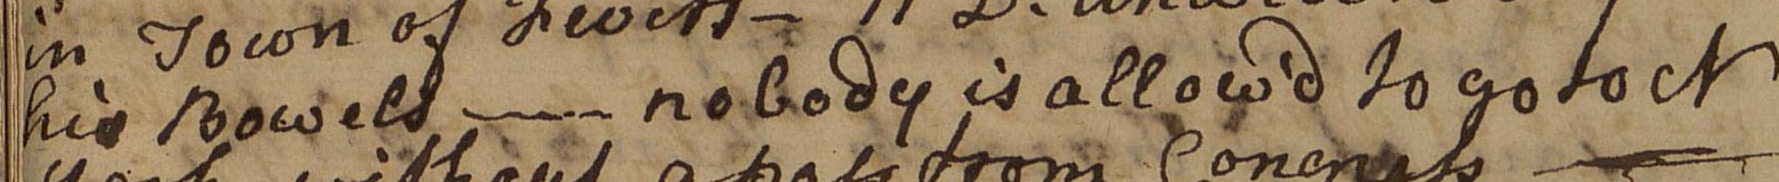his Bowels- nobody is allow'd to go to N
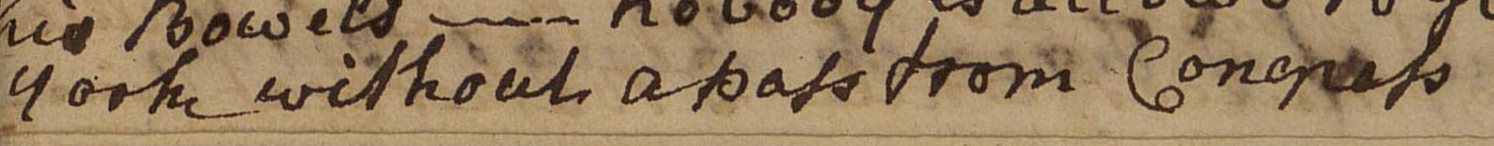York without a pass from Congress
